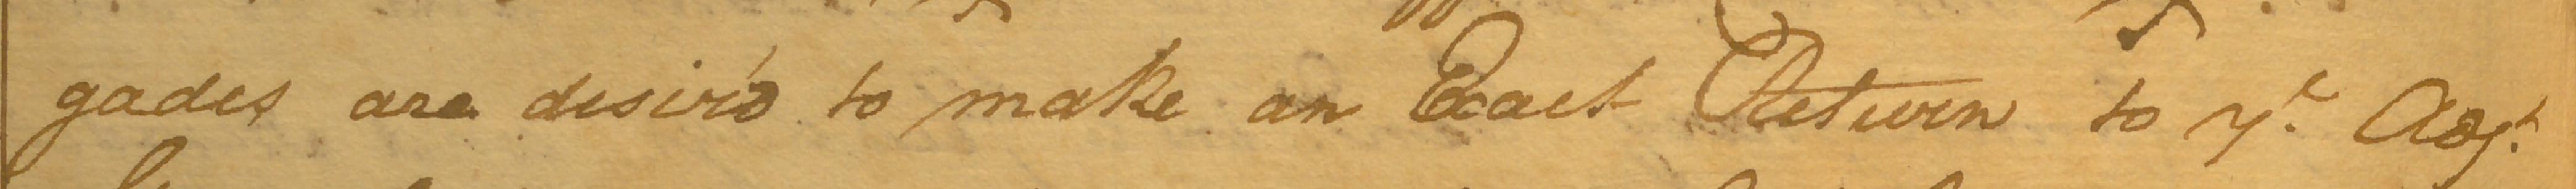gades are desir'd to make an Exact Return to y^e. Adj^t.
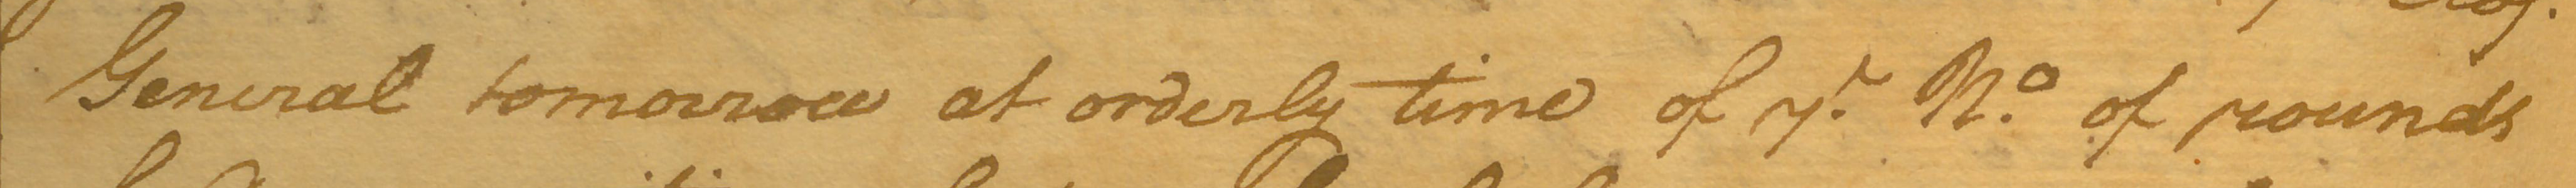General tomorrow at orderly time of y^e. N^o. of rounds
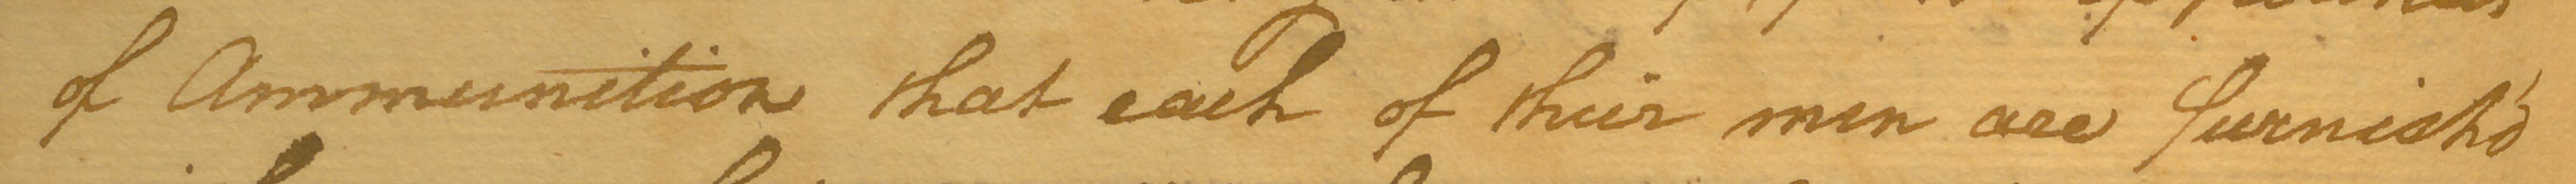of Ammunition that each of their men are furnish'd
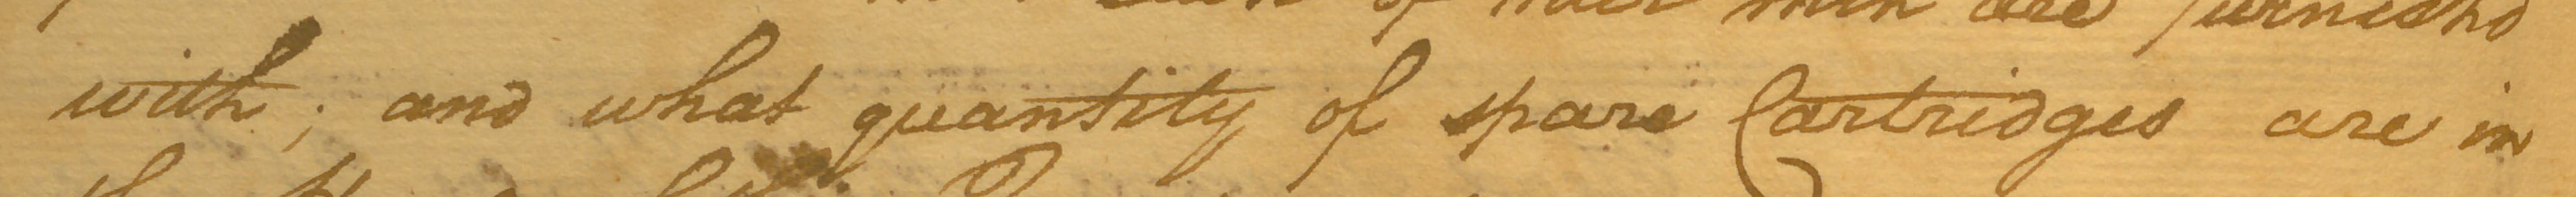with; and what quantity of spare Cartridges are in
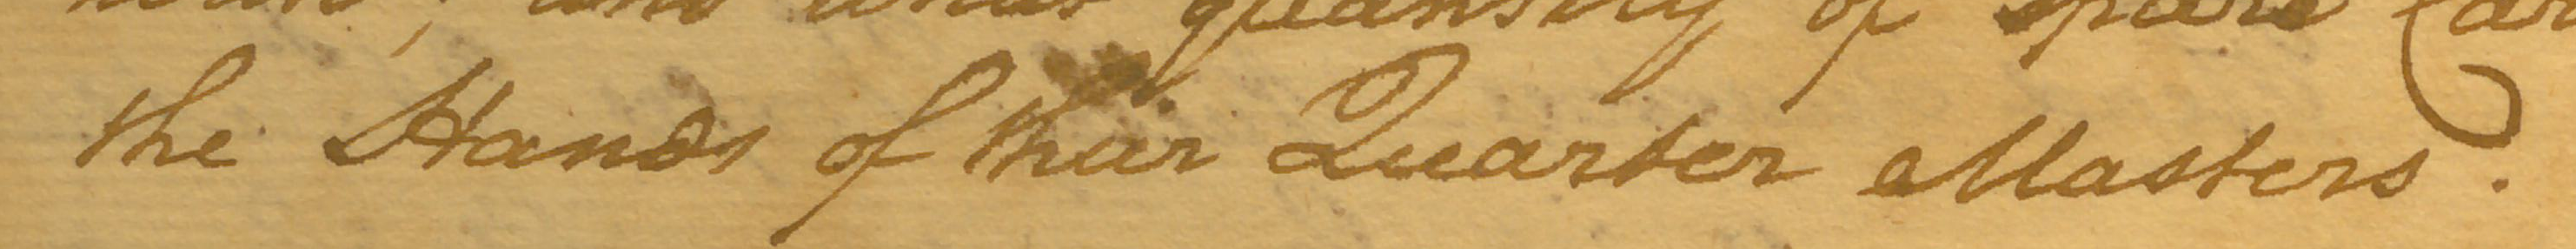the Hands of their Quarter Masters.
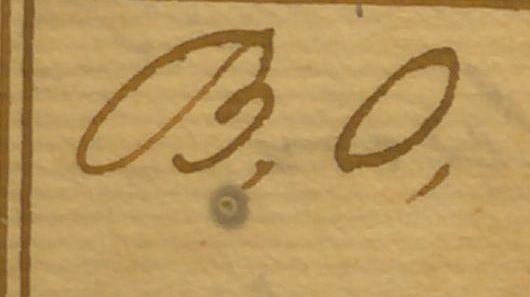B. O.
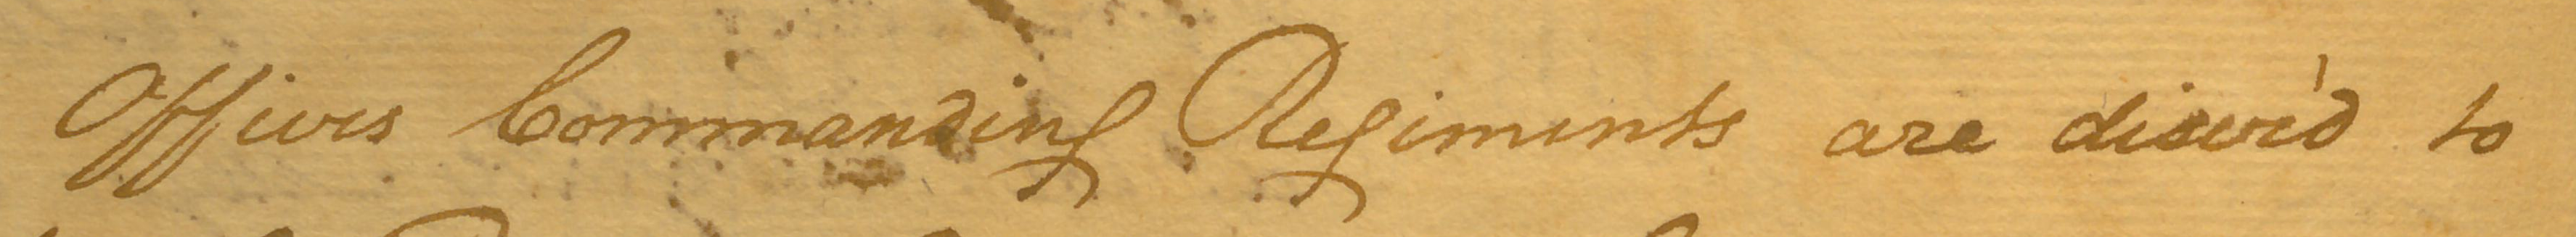Officers Commanding Regiments are desir'd to
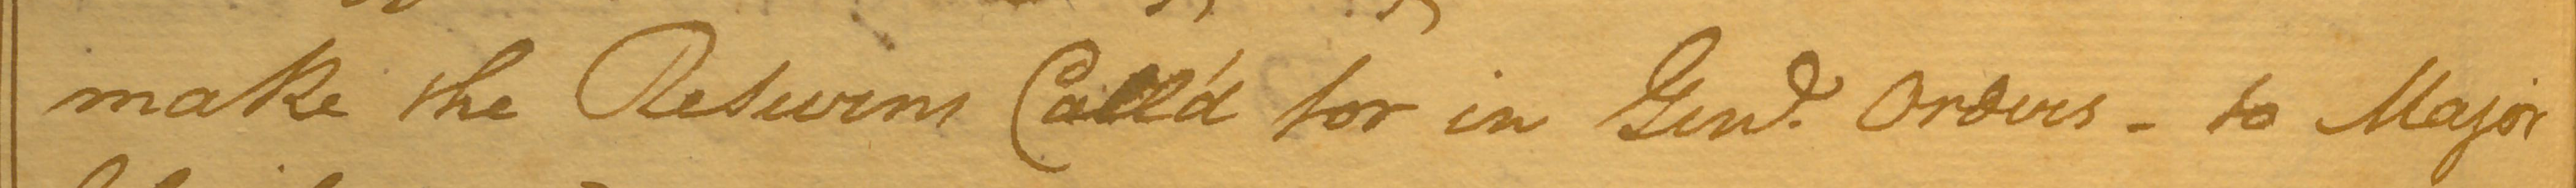make the Returns Call'd for in Gen^l. Orders. to Major
